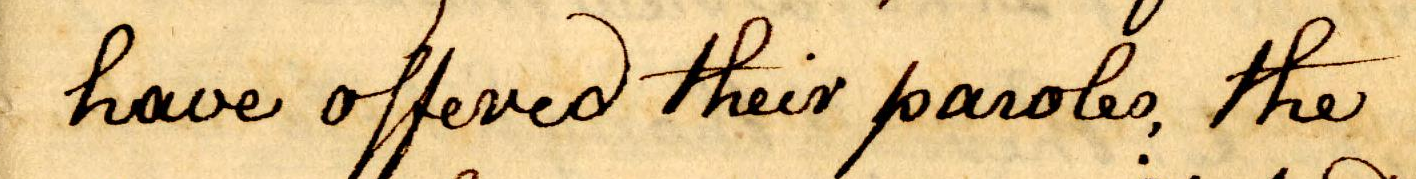have offered their paroles, the
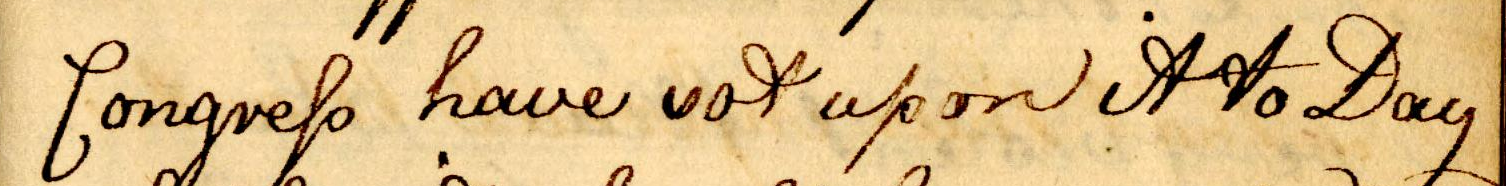Congress have sot upon it to Day
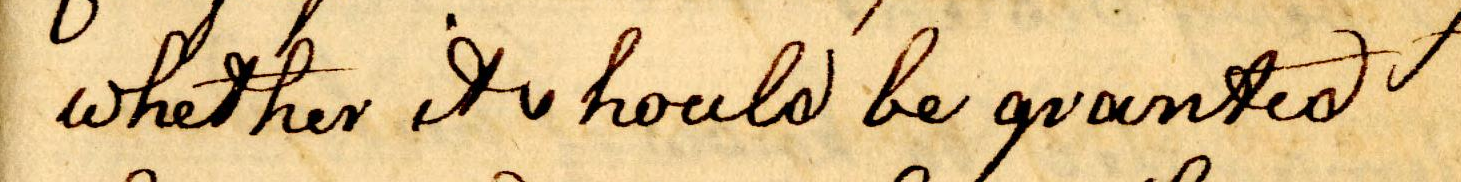whether it should be granted
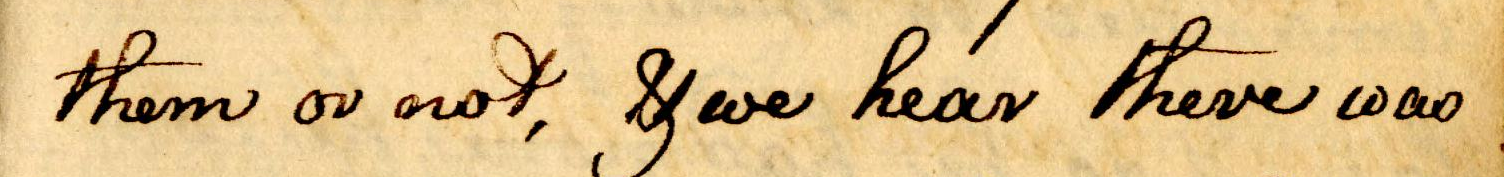them or not, & we hear there was
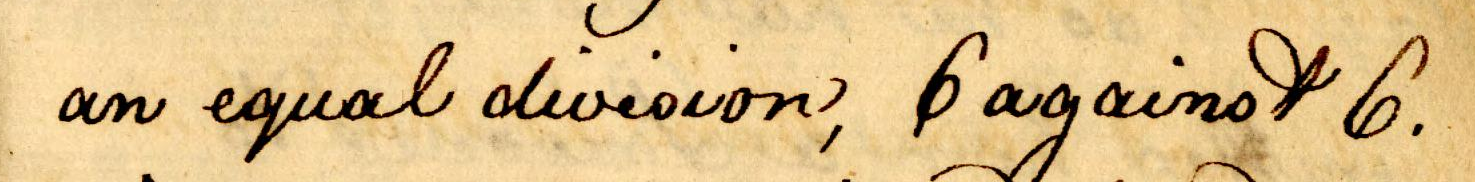an equal division, 6 against 6.
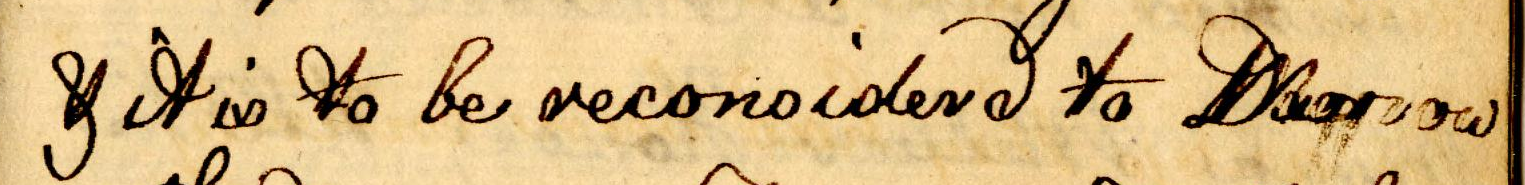& it is to be reconsidered to Morrow
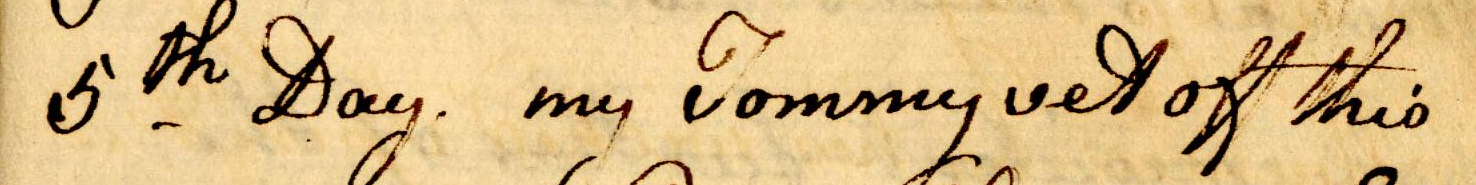5^th Day. my Tommy set off this
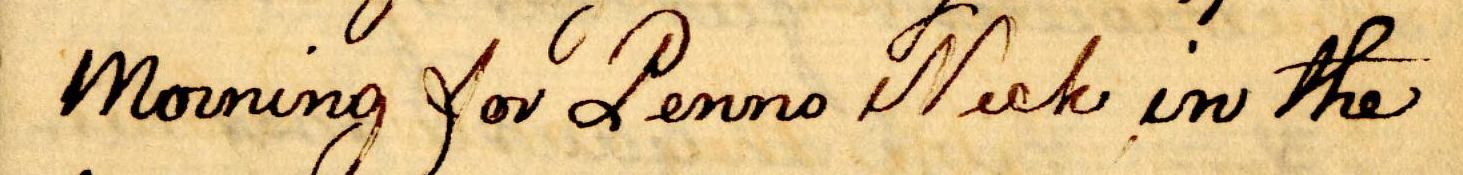Morning for Penns Neck in the
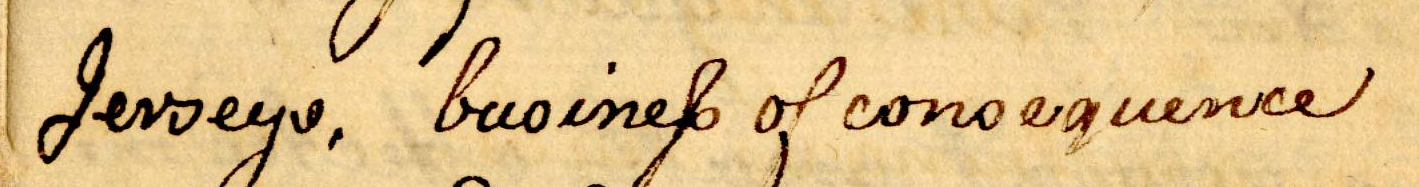Jerseys, business of consequence
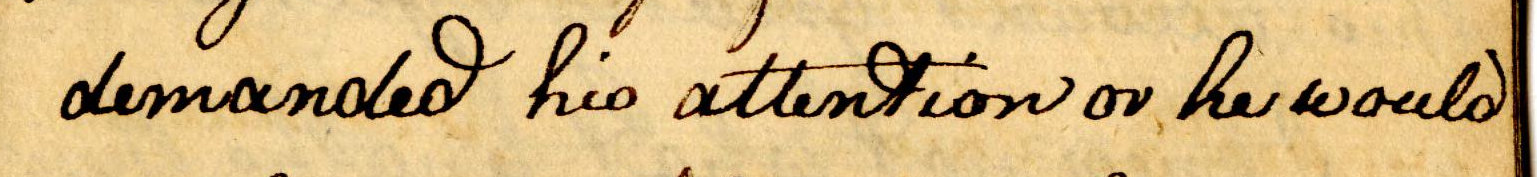demanded his attention or he would
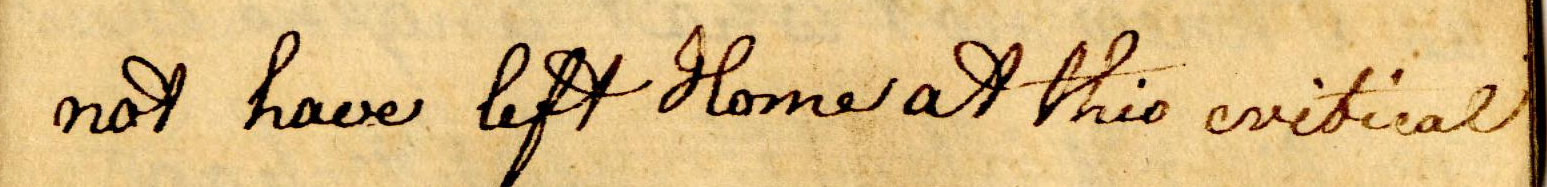not have left Home at this critical
